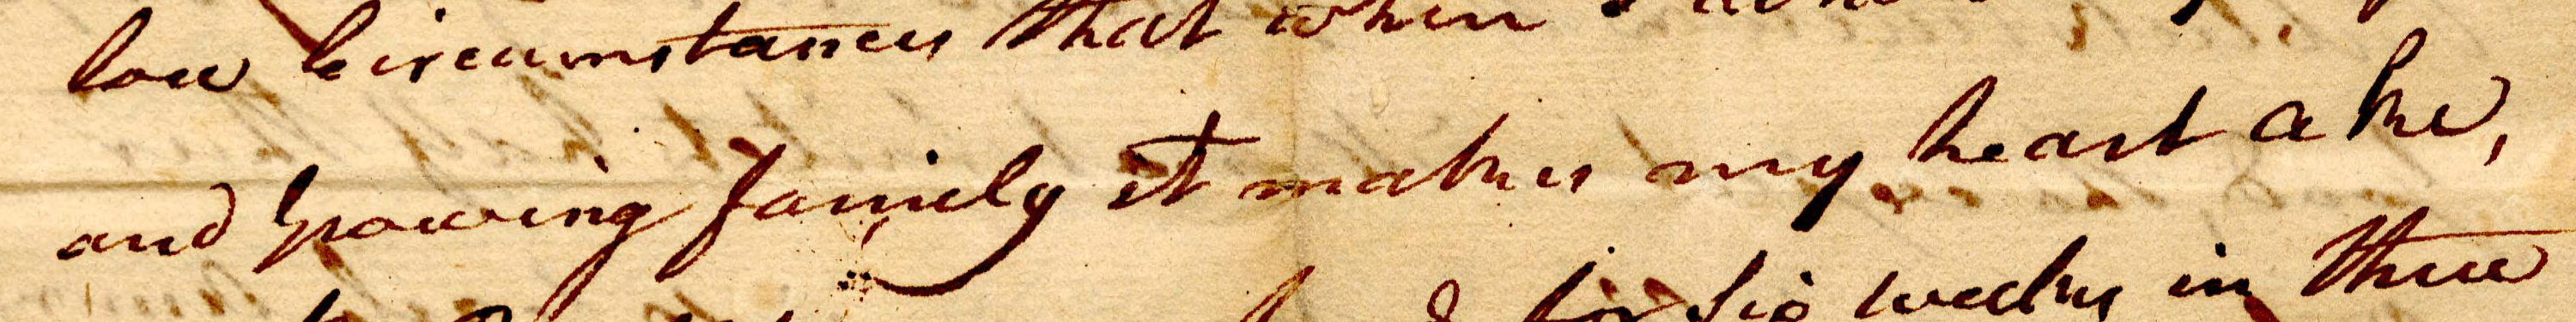and Growing family it makes my heart ake,
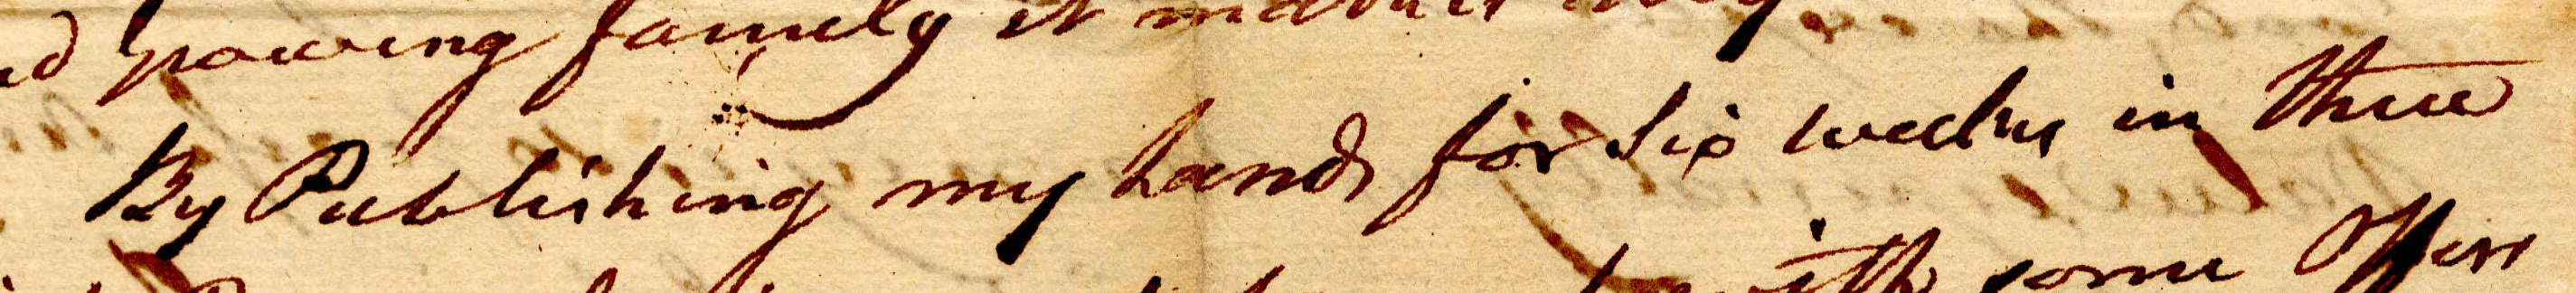By Publishing my hands for six weeks in three
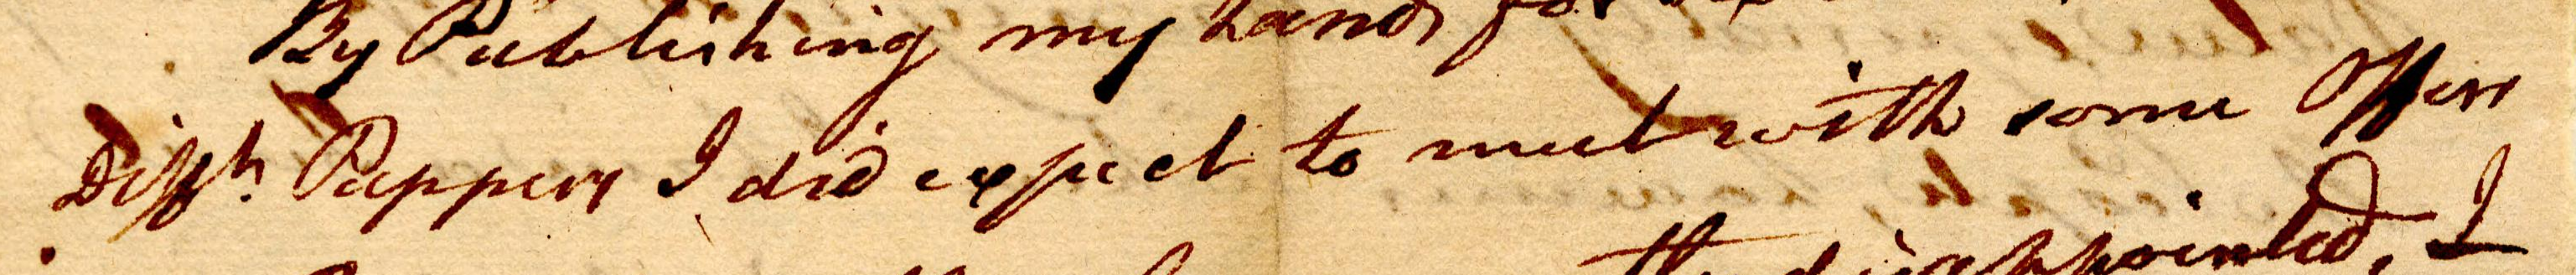Dif^t. Pappers I did expect to meet with some offers
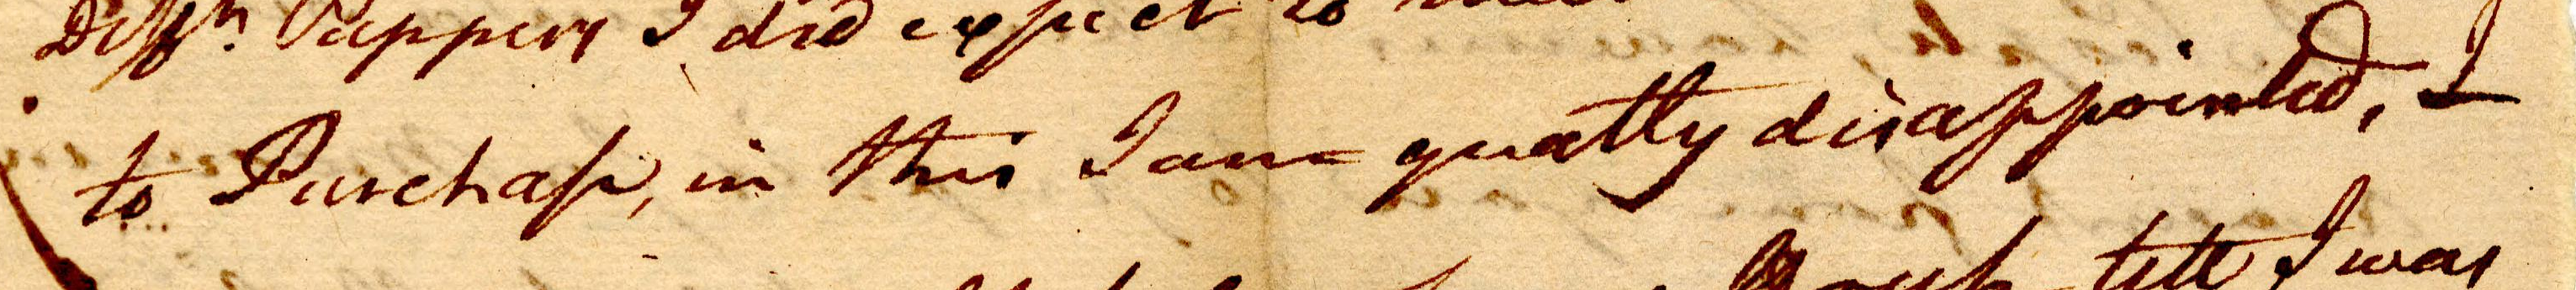to Purchase, in this I am greatly disappointed, I
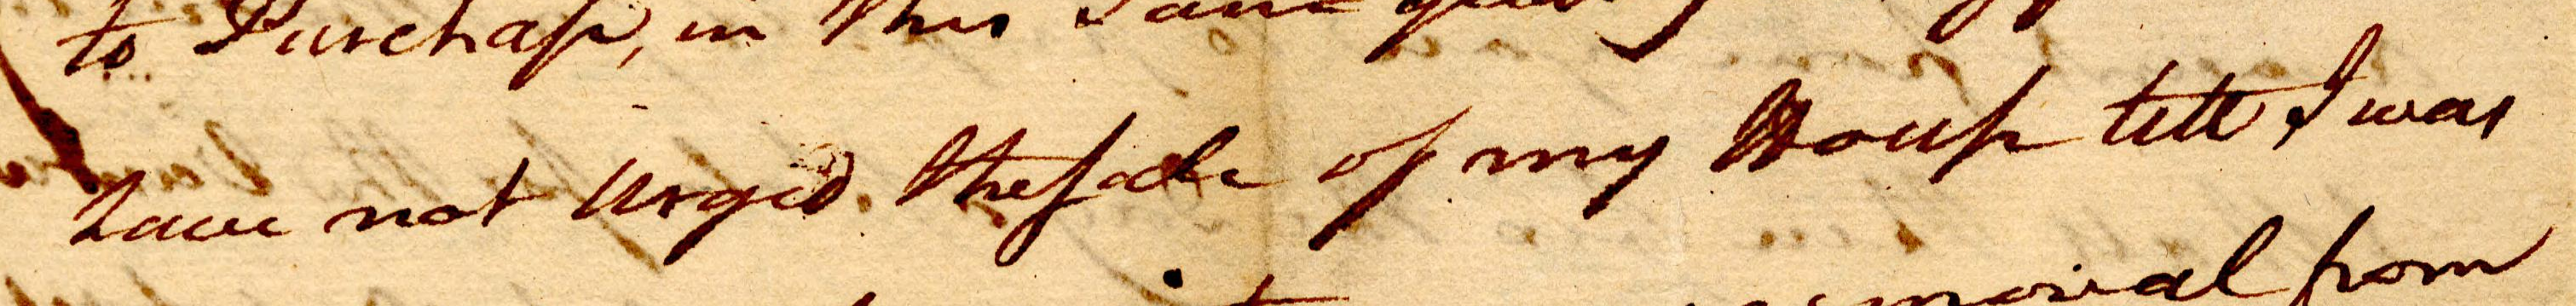have not urged, the sale of my House till I was
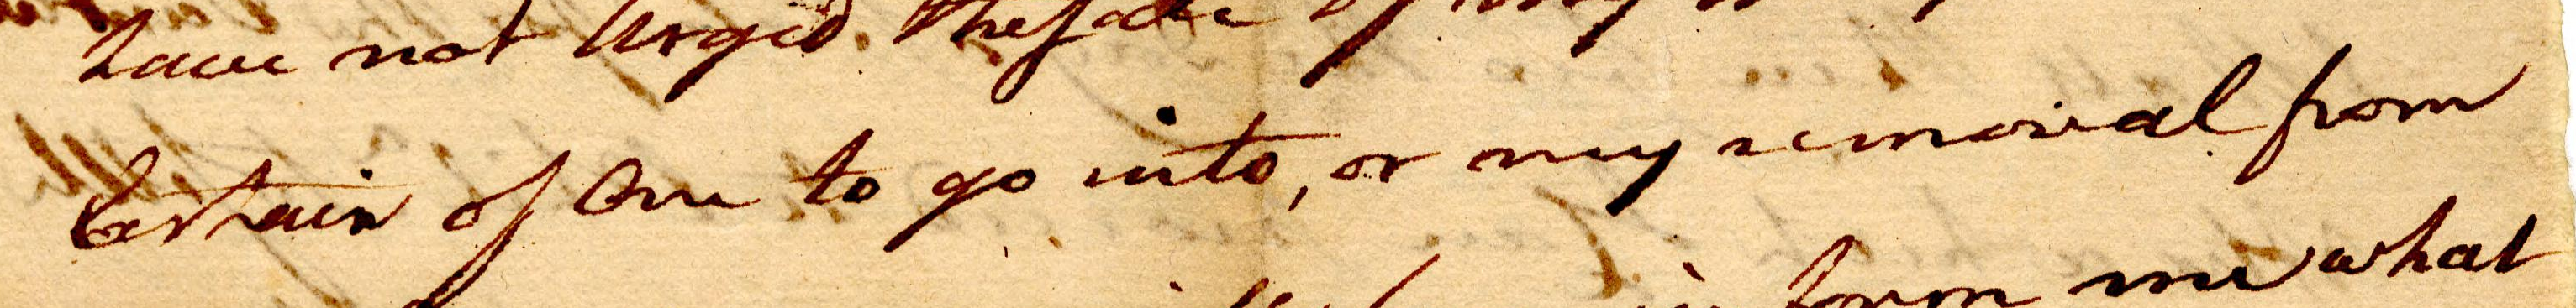Certain of one to go into, or any arrival from
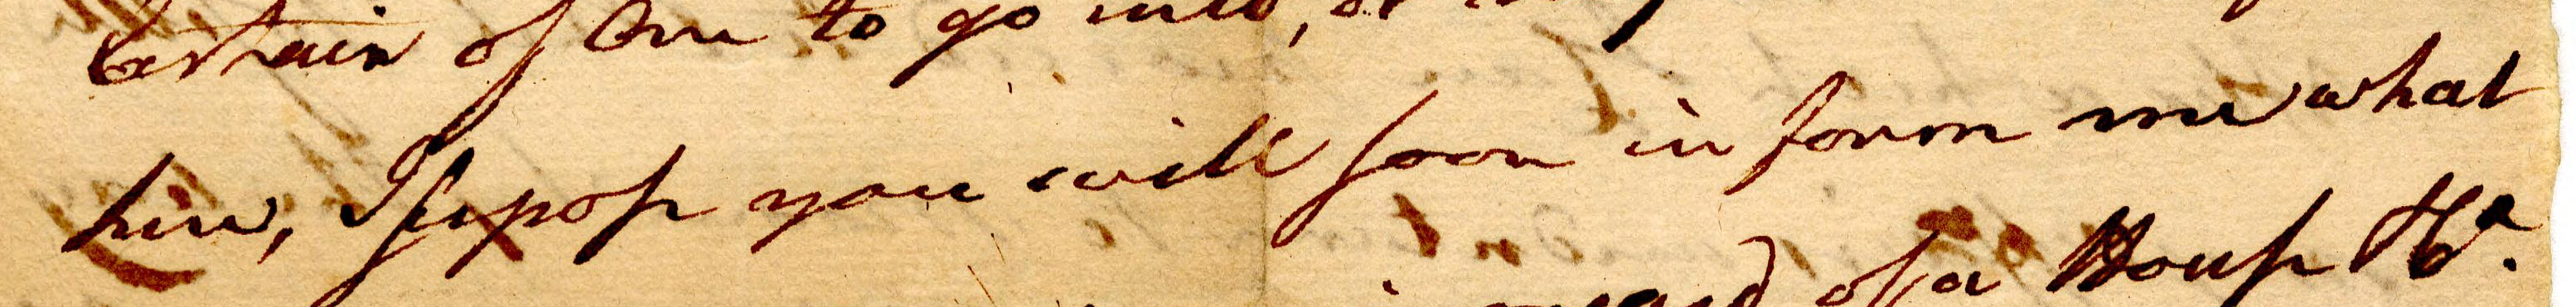here, I supos you will soon inform me what
